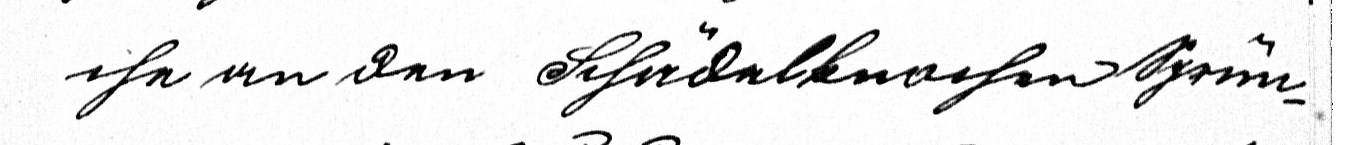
che an den Schädelknochen Sprün¬
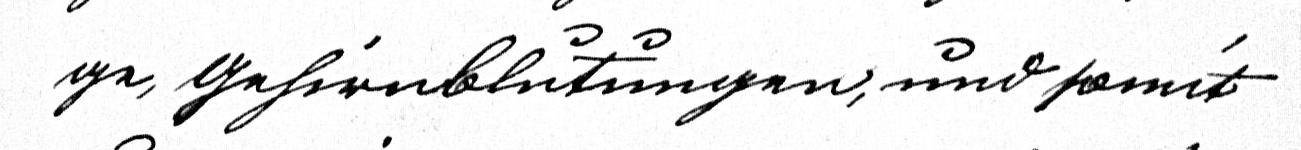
ge, Gehirnblutungen, und somit
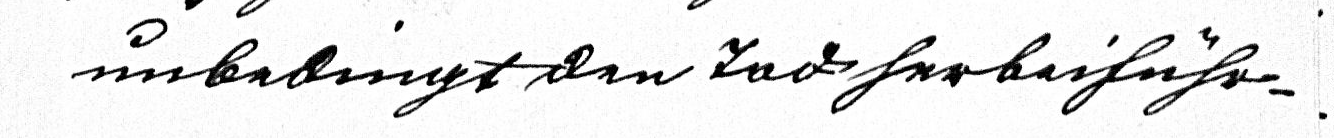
unbedingt den Tod herbeiführ¬
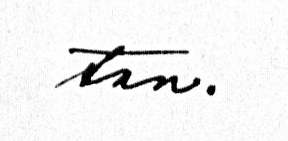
ten.
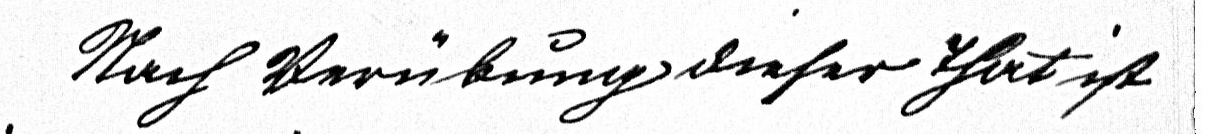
Nach Verübung dieser that ist
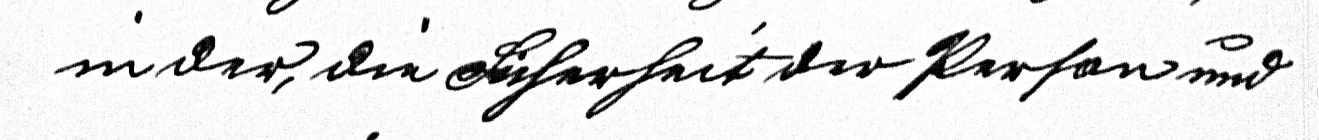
in der, die Sicherheit der Person und
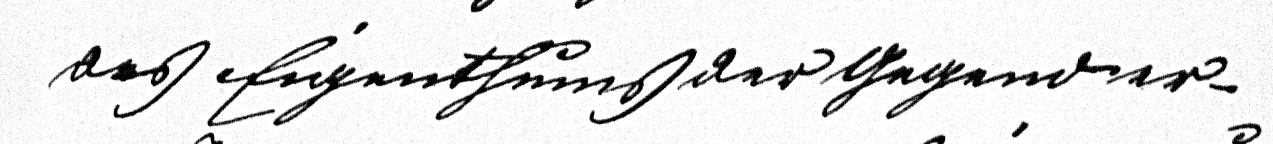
des Eigenthums der Gegend er¬
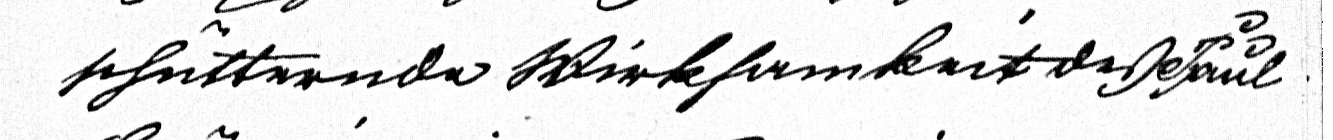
schütternde Wirksamkeit des Paul
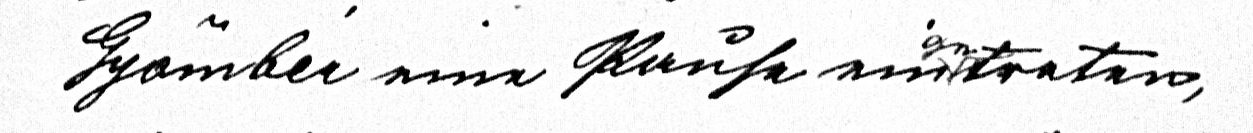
Gyömber eine Pause eingetreten,
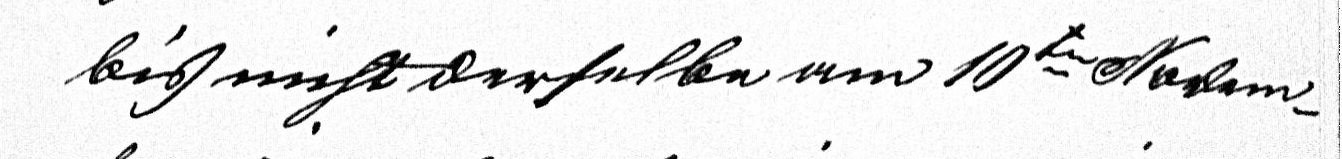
bis nicht derselbe am 10ten Novem¬
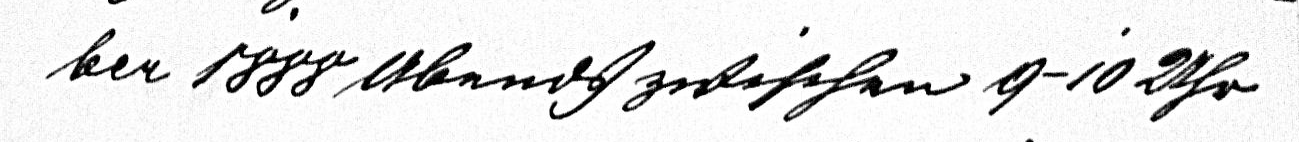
ber 1888 Abends zwischen 9-10 Uhr
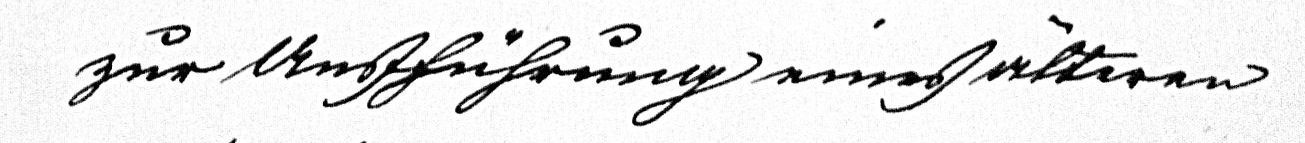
zur Ausführung eines älteren
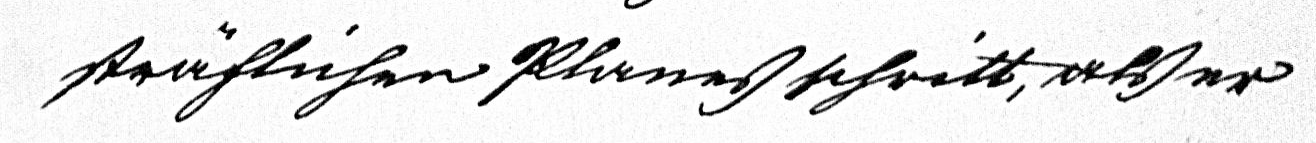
sträflichen Planes schritt, als er
